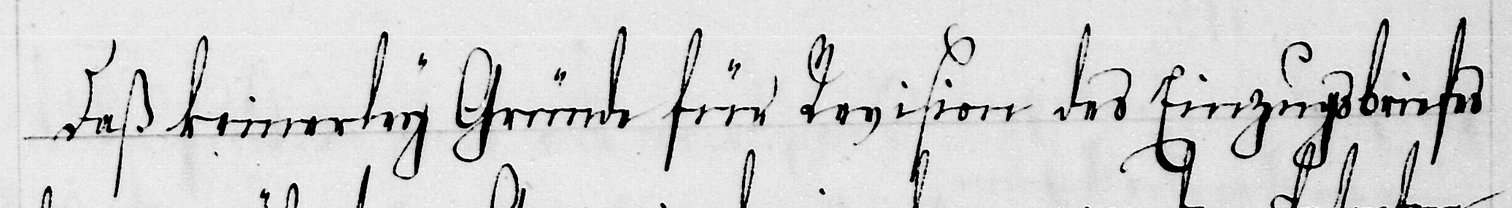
Daß keinerley Gründe für Revision des Einzugsbriefes
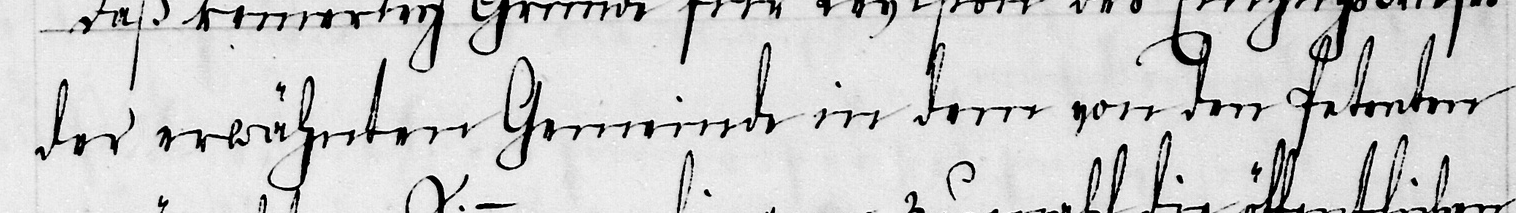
der erwähnten Gemeinde in dem von den Petenten
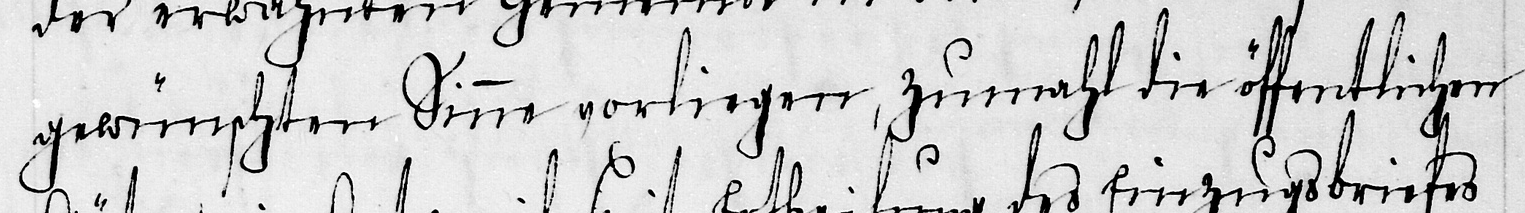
gewünschten Sinne vorliegen, zumahl die öffentlichen
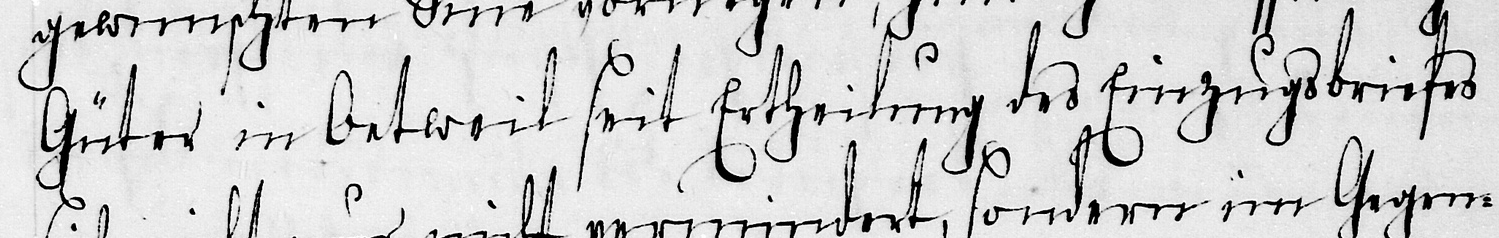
Güter in Oetweil seit Ertheilung des Einzugsbriefes
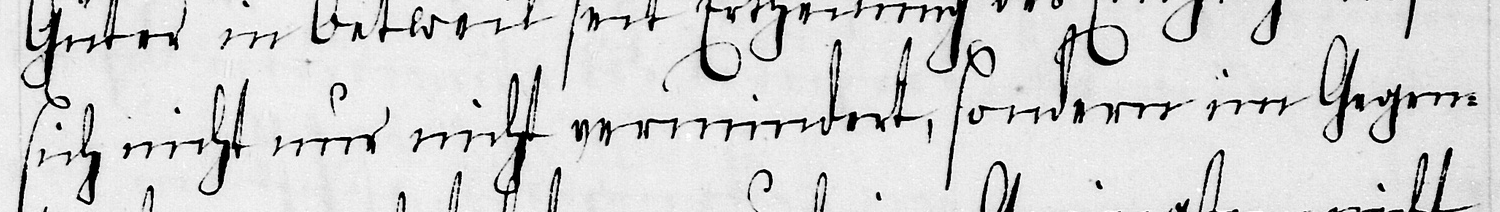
sich nicht nur nicht vermindert, sondern im Gegen¬
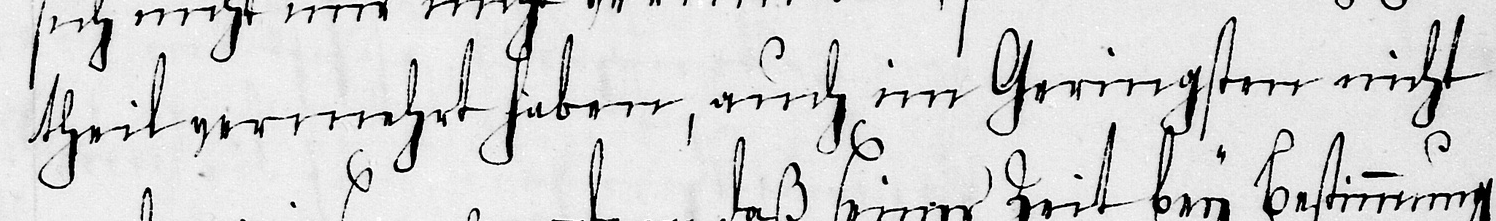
theil vermehrt haben, auch im Geringsten nicht
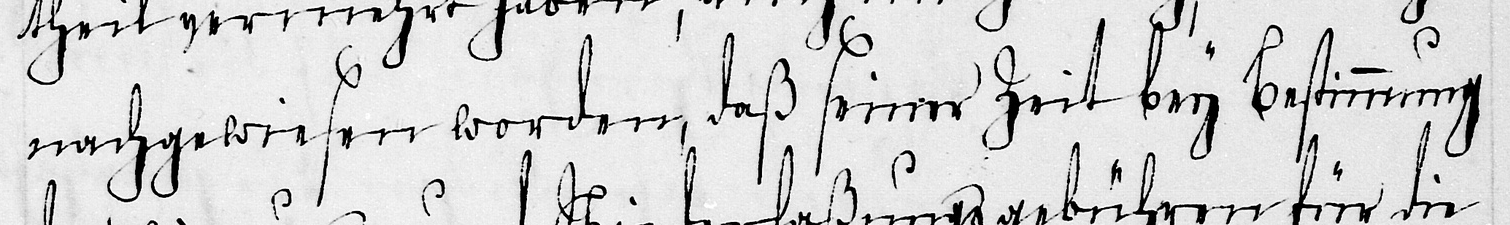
nachgewiesen worden, daß seiner Zeit bey Bestimmung
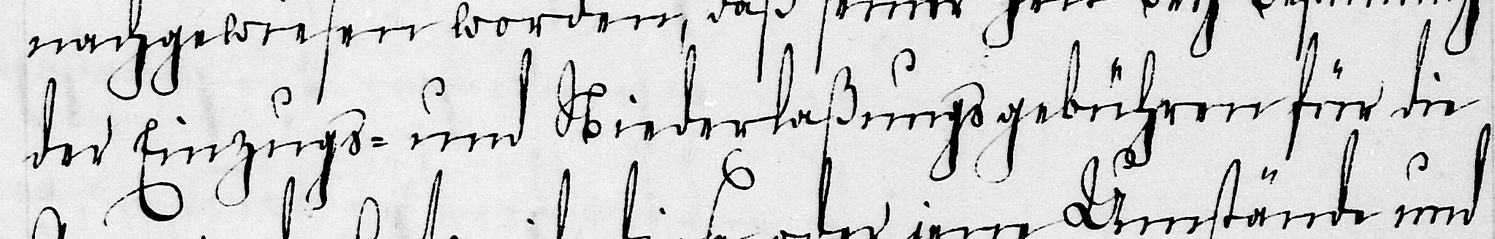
der Einzugs- und Niederlaßungsgebühren für die
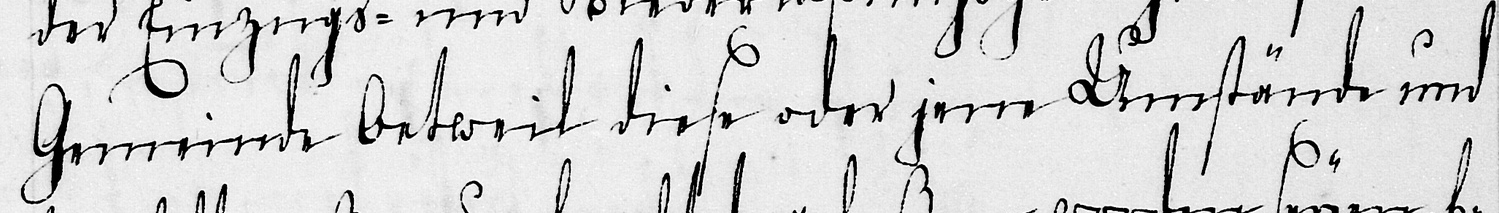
Gemeinde Oetweil diese oder jene Umstände und
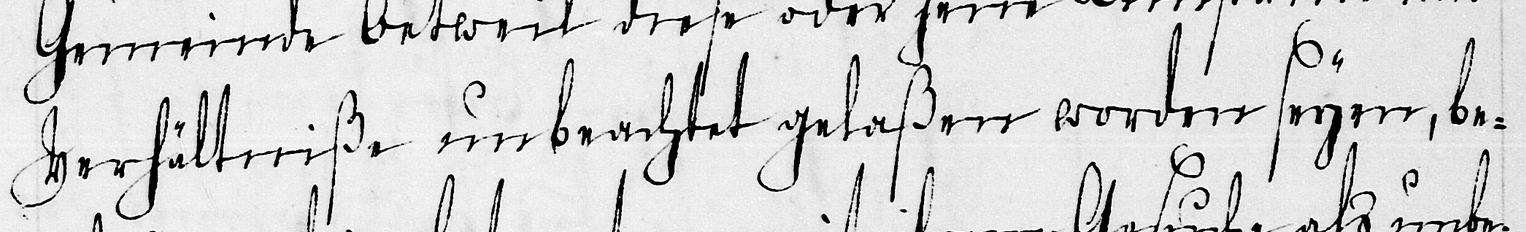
Verhältniße unbeachtet gelaßen worden seyen, be¬
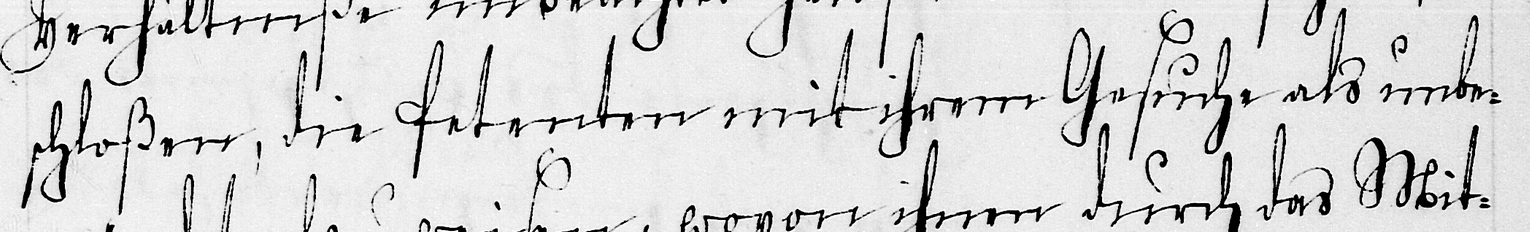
schloßen, die Petenten mit ihrem Gesuche als unbe¬
